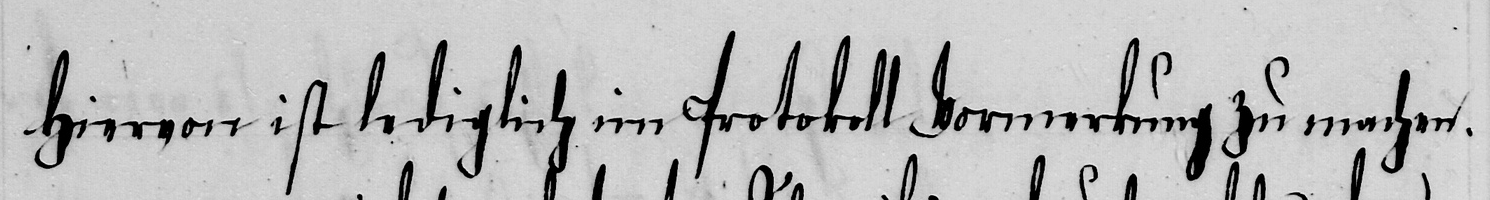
Hiervon ist lediglich im Protokoll Vormerkung zu machen.
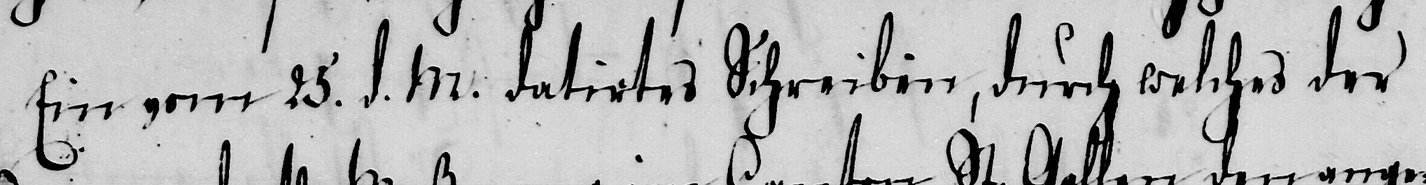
Ein vom 25. d. M. datirtes Schreiben, durch welches der
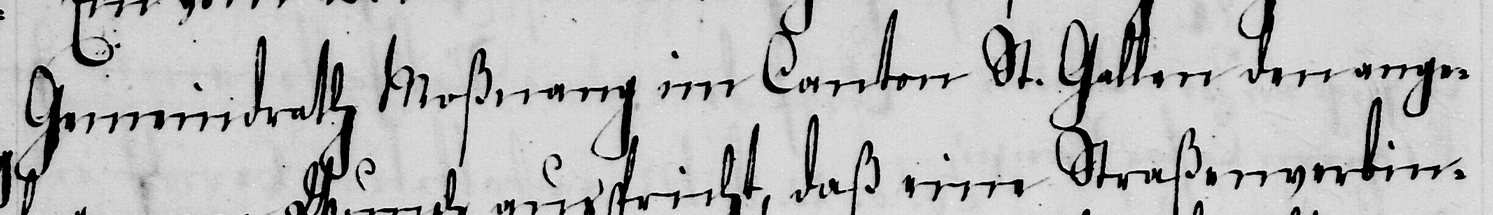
Gemeindrath Moßnang im Canton St. Gallen den ange¬
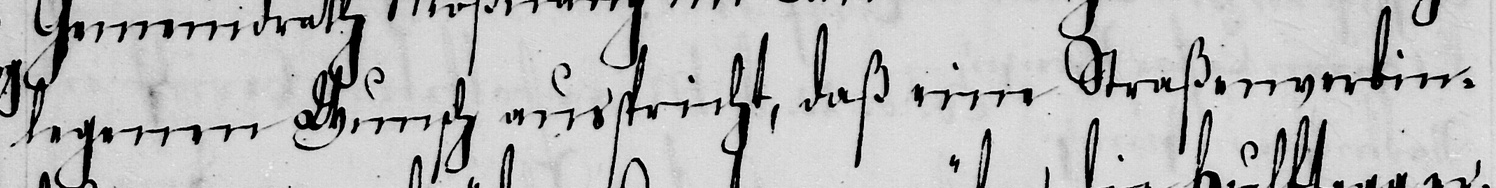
legenen Wunsch ausspricht, daß eine Straßenverbin¬
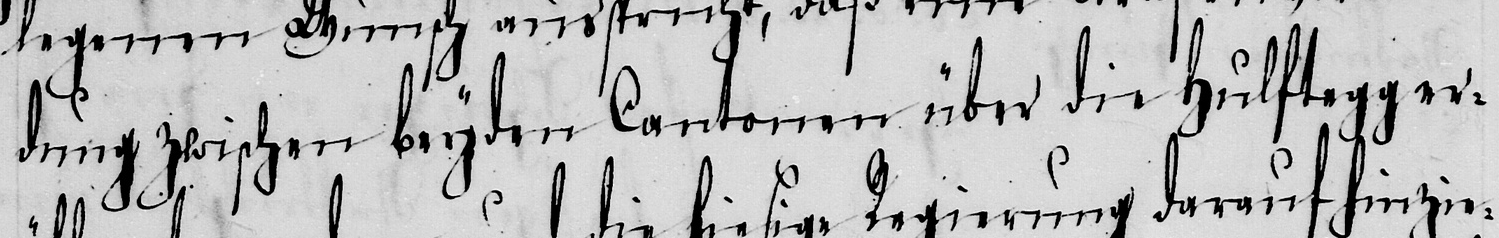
dung zwischen beyden Cantonen über die Hulftegg er¬
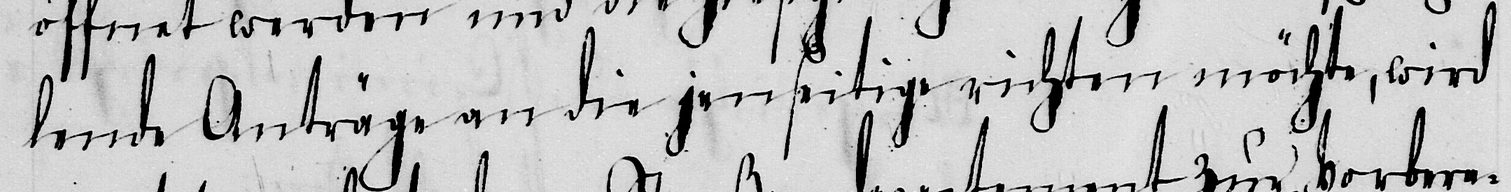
elende Anträge an die jenseitige richten möchte, wird
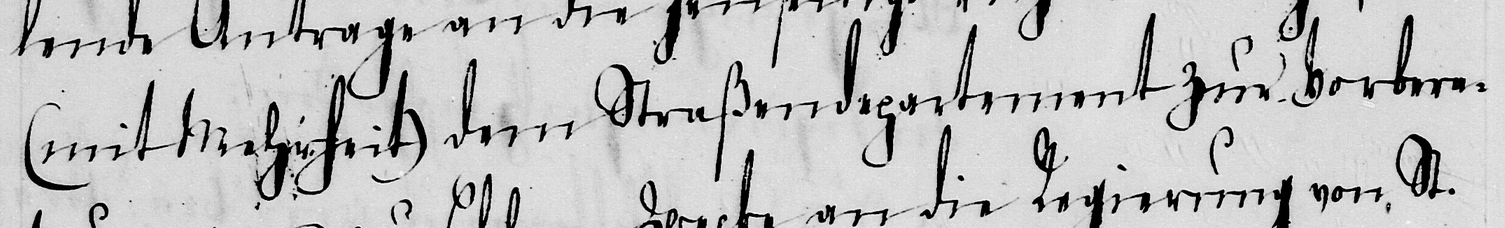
(mit Mehrheit) dem Straßendepartement zur Vorbera¬
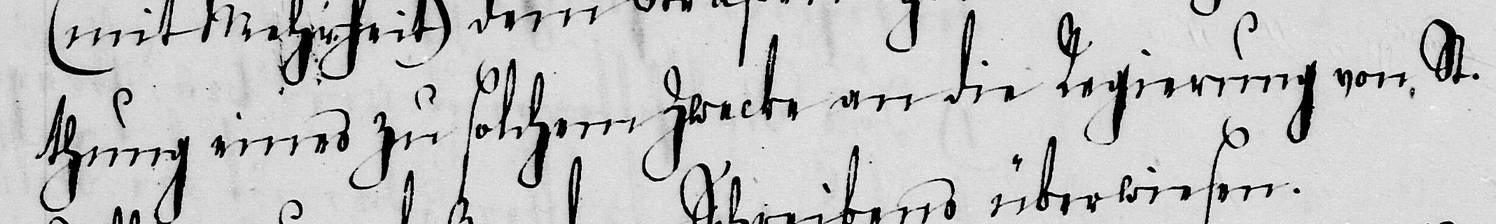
thung eines zu solchem Zwecke an die Regierung von St.
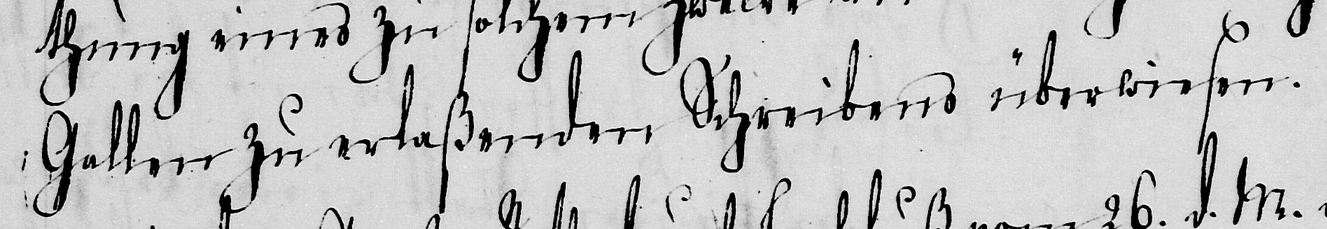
Gallen zu erlaßenden Schreibens überwiesen.
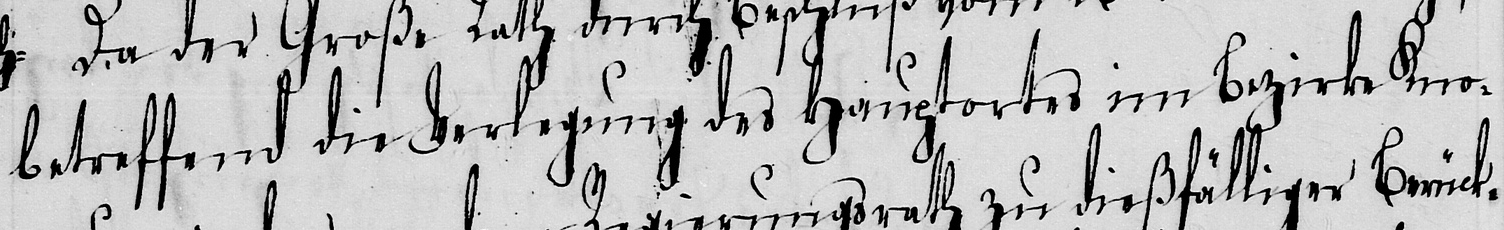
betreffend die Verlegung des Hauptortes im Bezirke Kno¬
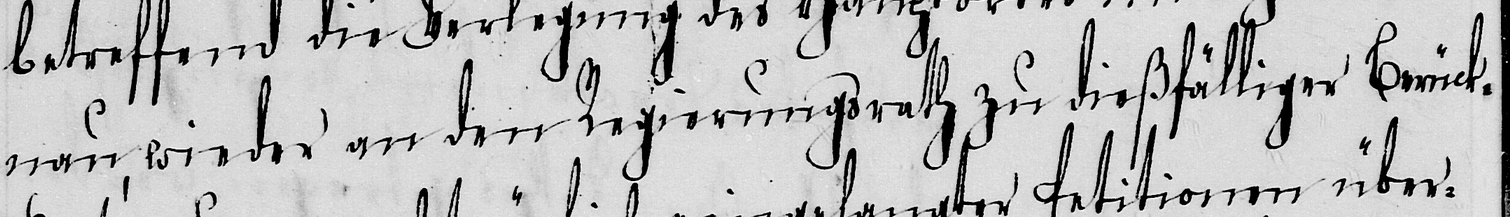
nau, wieder an den Regierungsrath zu dießfälliger Berück¬
